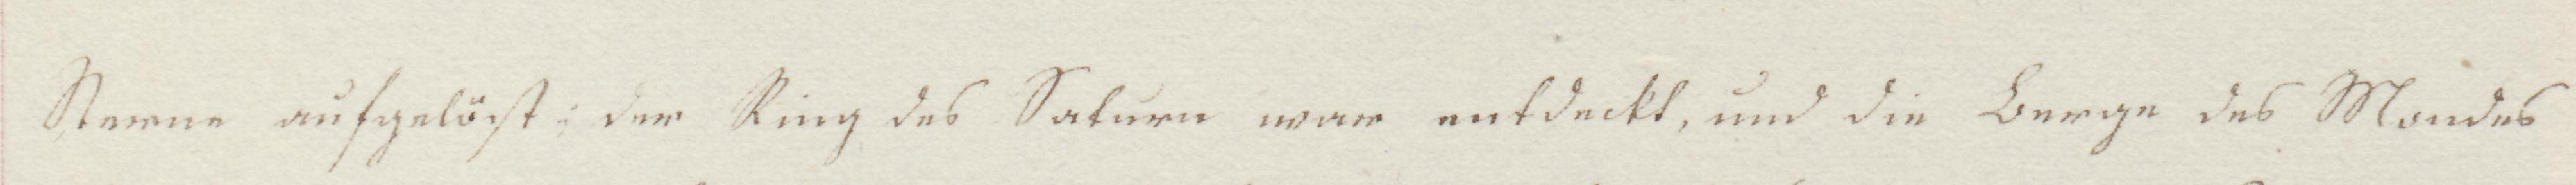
Sterne aufgelöst; der Ring des Saturn war entdeckt, und die Berge des Mondes
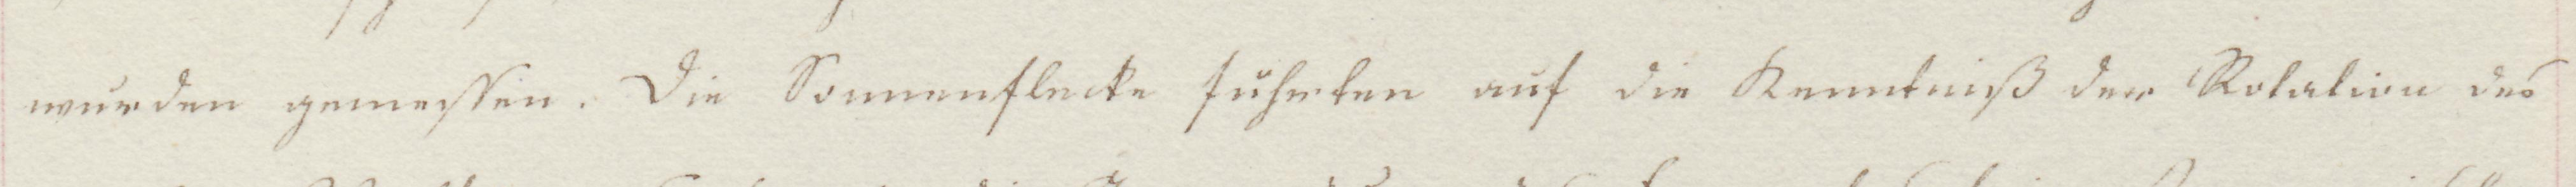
wurden gemessen. Die Sonnenflecke führten auf die Kenntniß der Rotation des
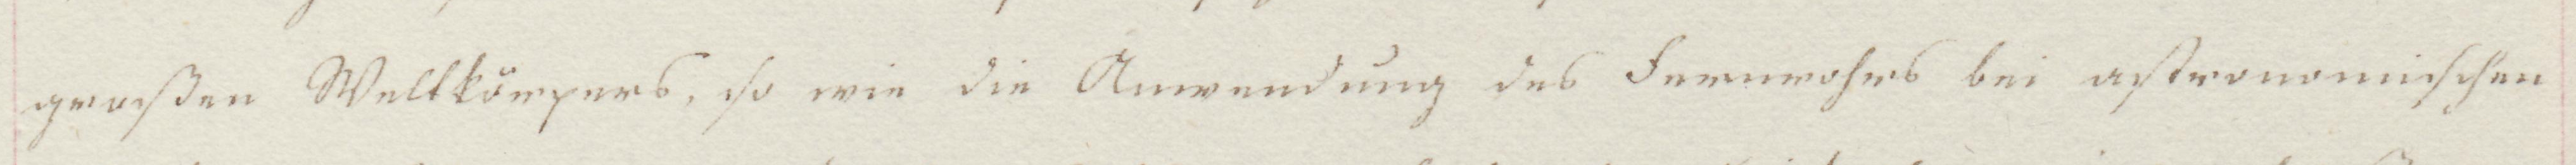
großen Weltkörpers, so wie die Anwendung des Fernrohrs bei astronomischen
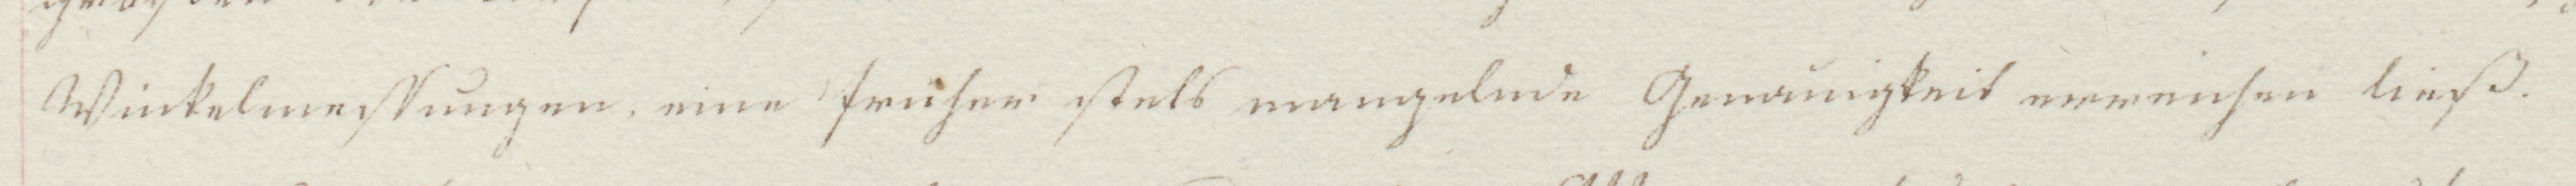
Winkelmessungen, eine früher stets mangelnde Genauigkeit erreichen ließ.
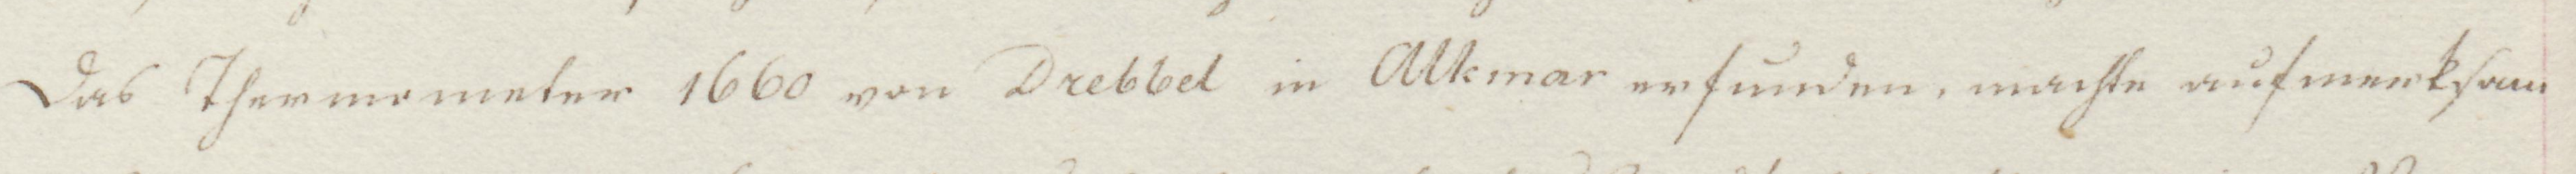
Das Thermometer 1660 von Drebbel in Alkmar erfunden, machte aufmerksam
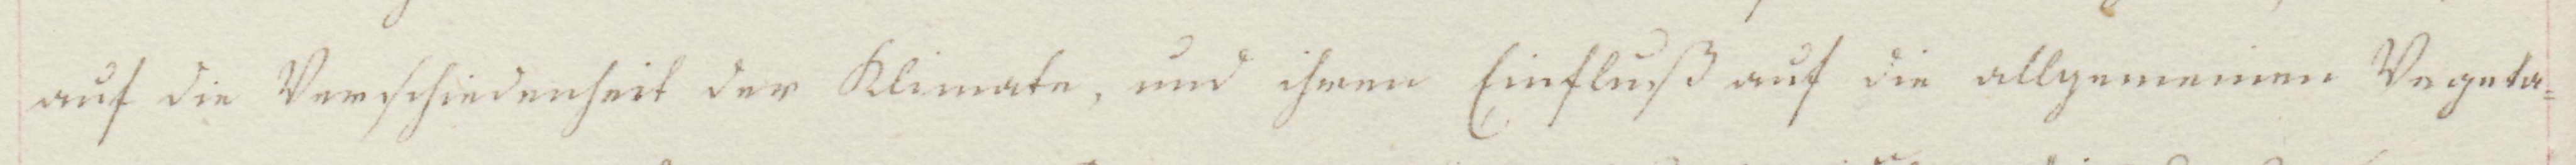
auf die Verschiedenheit der Klimate, und ihren Einfluß auf die allgemeinen Vegeta-
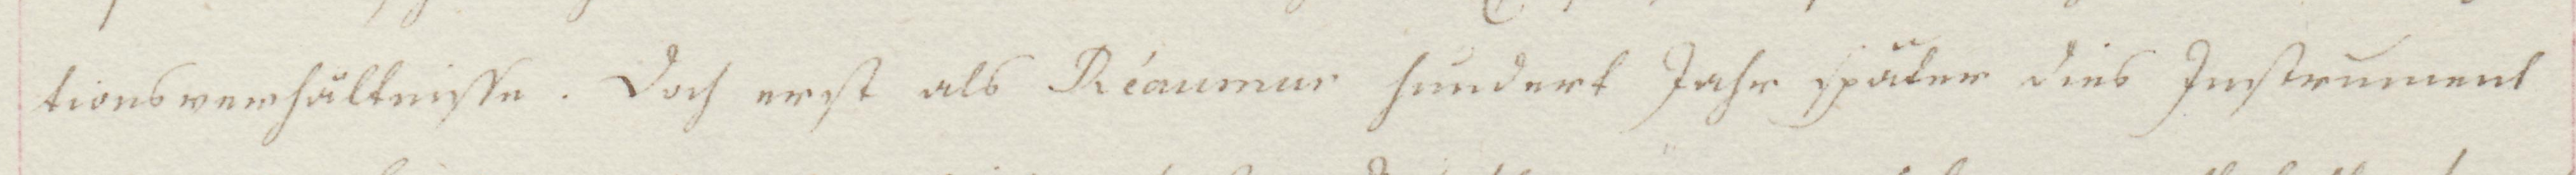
tionsverhältnisse. Doch erst als Réaumur hundert Jahr später dies Instrument
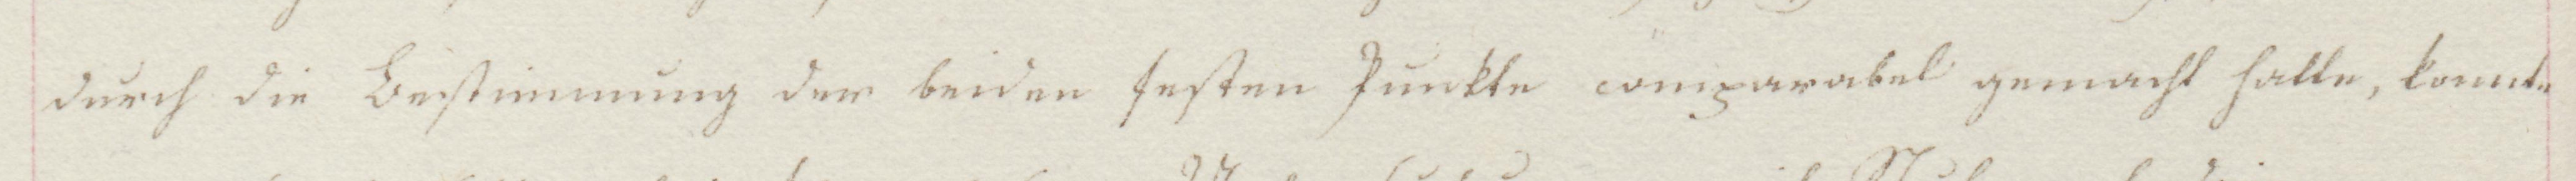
durch die Bestimmung der beiden festen Punkte comparabel gemacht hatte, konnte
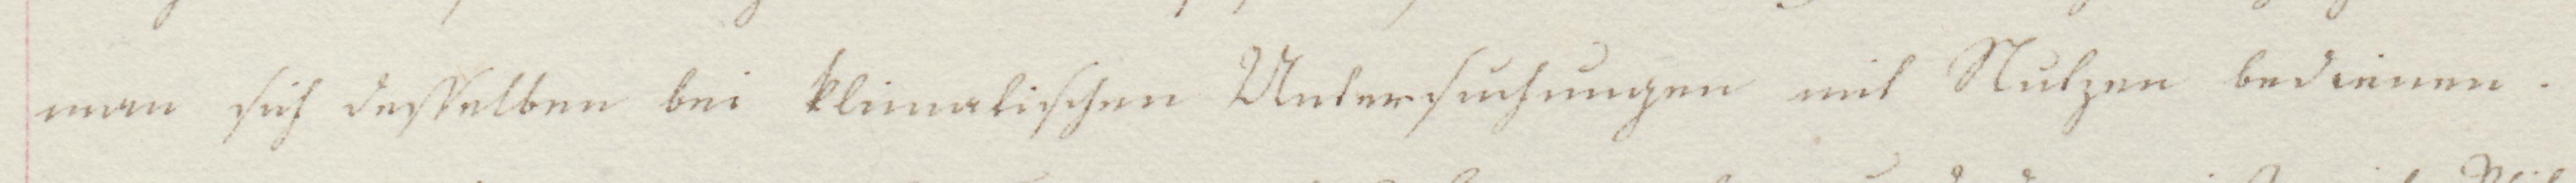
man sich desselben bei klimatischen Untersuchungen mit Nutzen bedienen.
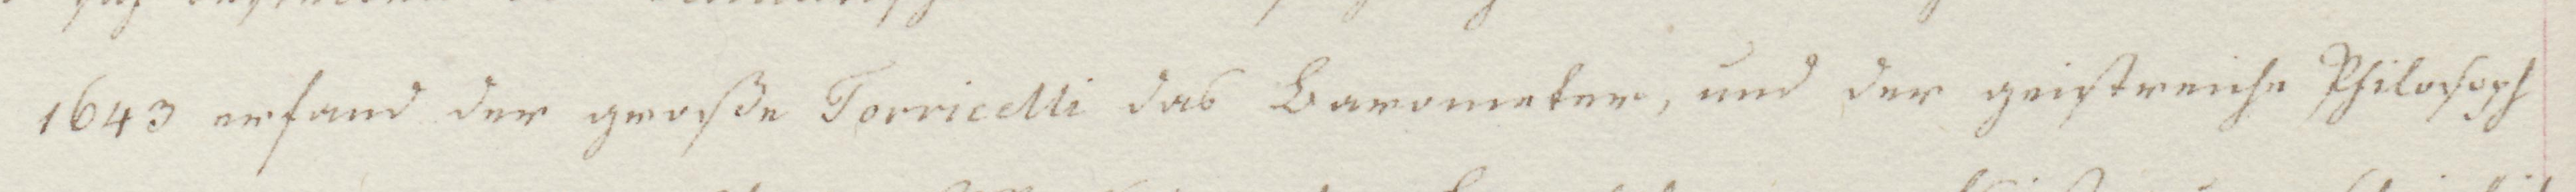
1643 erfand der große Torricelli das Barometer, und der geistreiche Philosoph
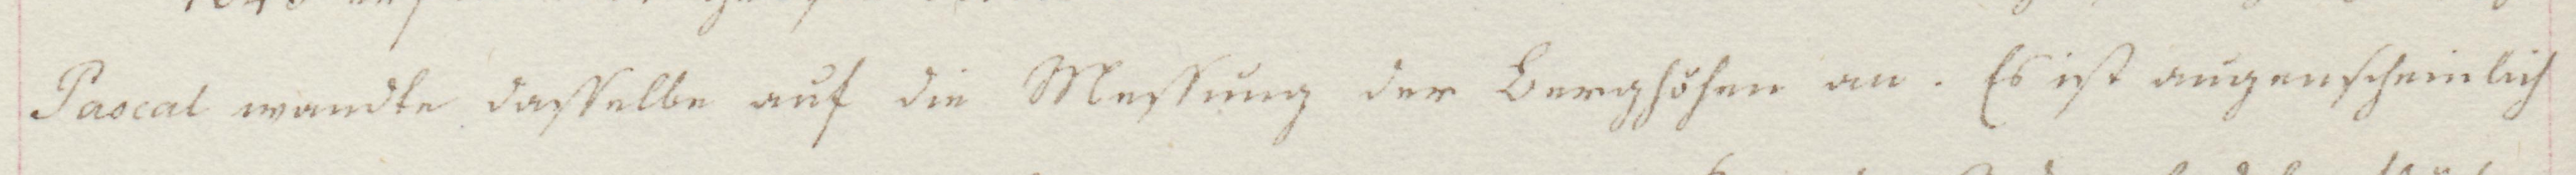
Pascal wandte dasselbe auf die Messung der Berghöhen an. Es ist augenscheinlich
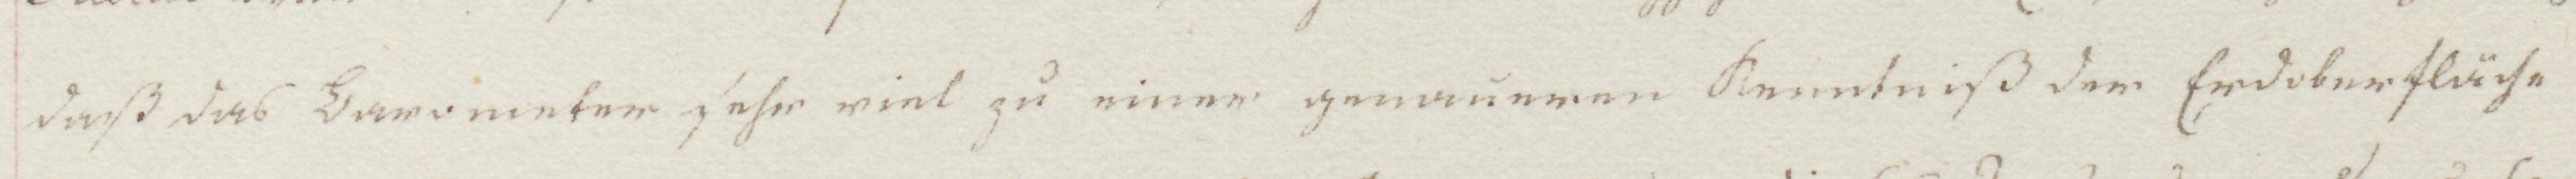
daß das Barometer sehr viel zu einer genaueren Kenntniß der Erdoberfläche
